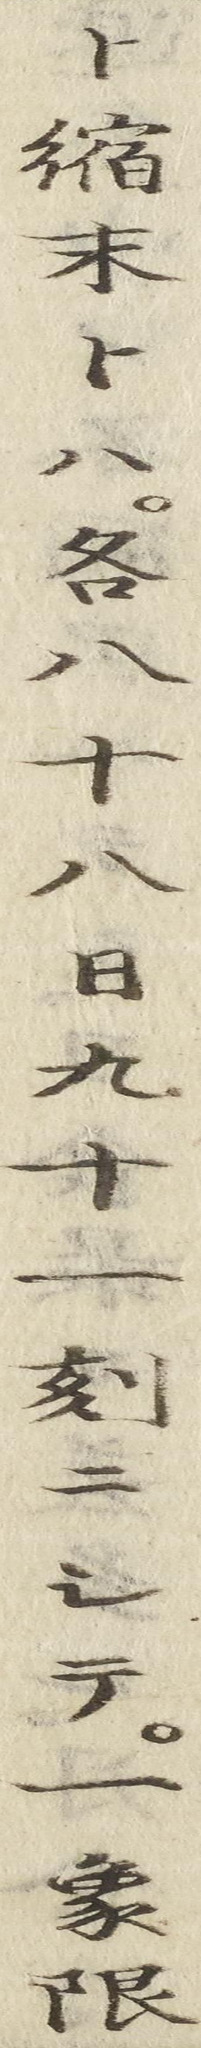ト縮末トハ。各八十八日九十一刻ニシテ。一象限
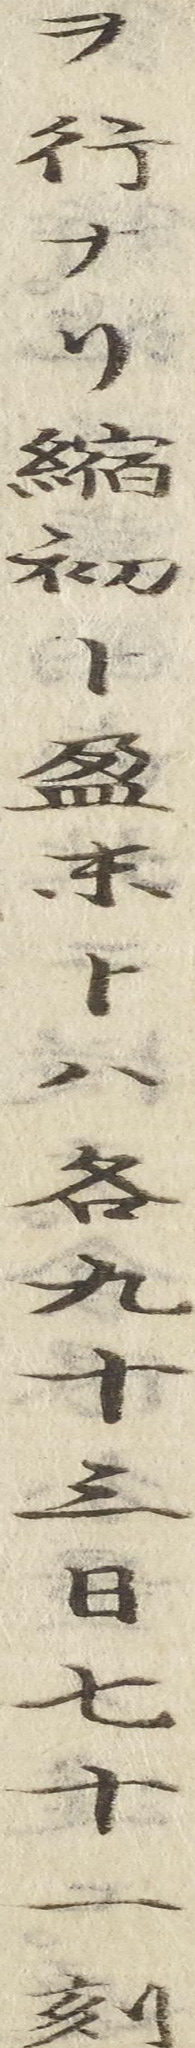ヲ行ナリ縮初ト盈末トハ各九十三日七十一刻
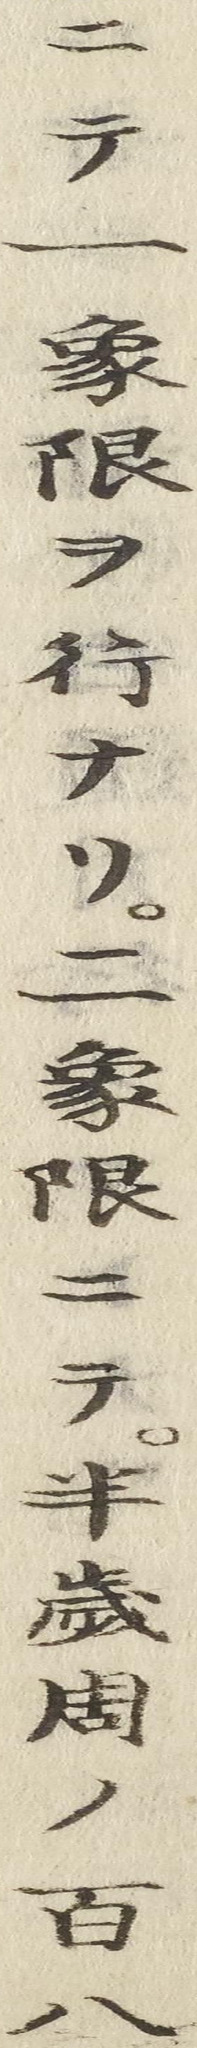ニテ一象限ヲ行ナリ。ニ象限ニテ。半歳周ノ百八
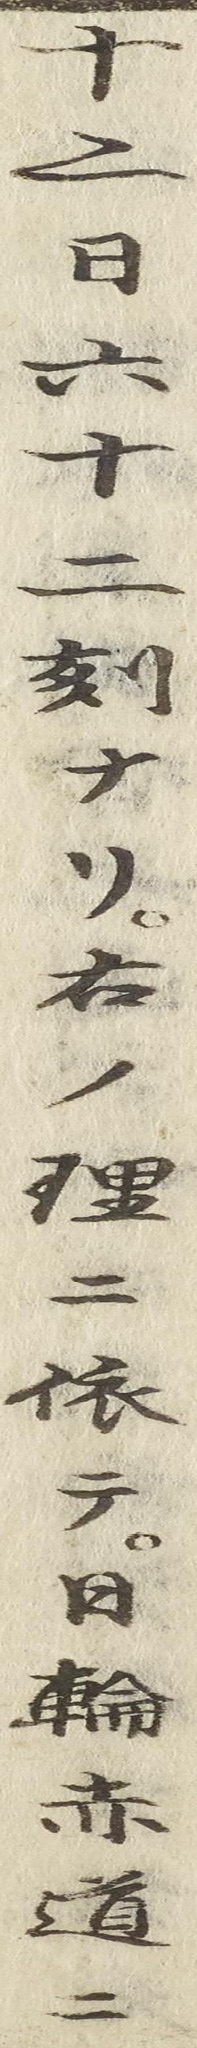十ニ日六十二刻ナリ。右ノ理ニ依テ。日輪赤道ニ
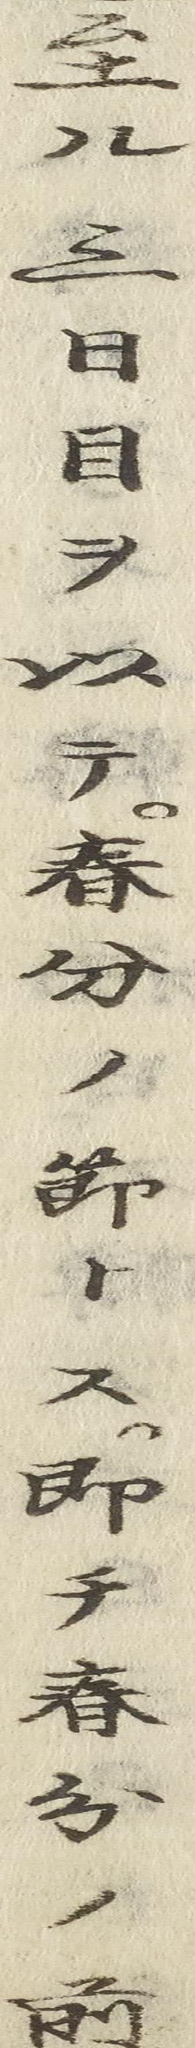至ル三日目ヲ以テ。春分ノ節トス。即チ春分ノ前
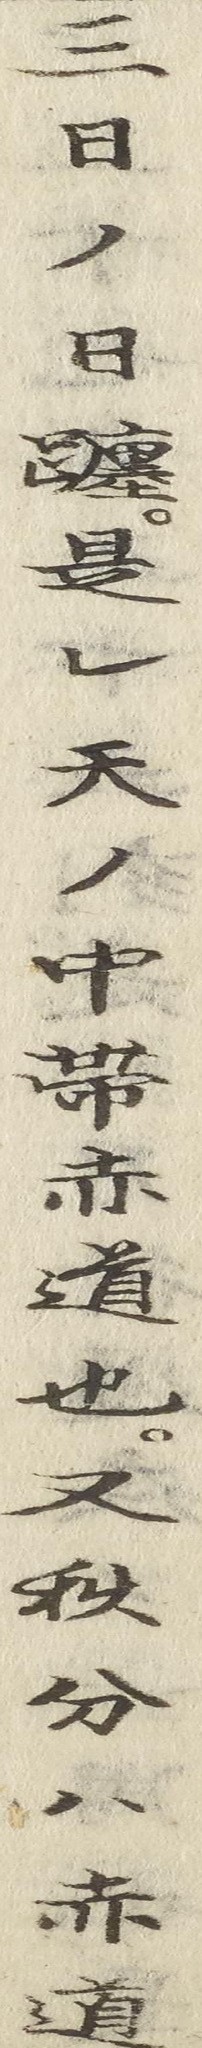三日ノ日躔。是レ天ノ中帯赤道也。又秋分ハ赤道
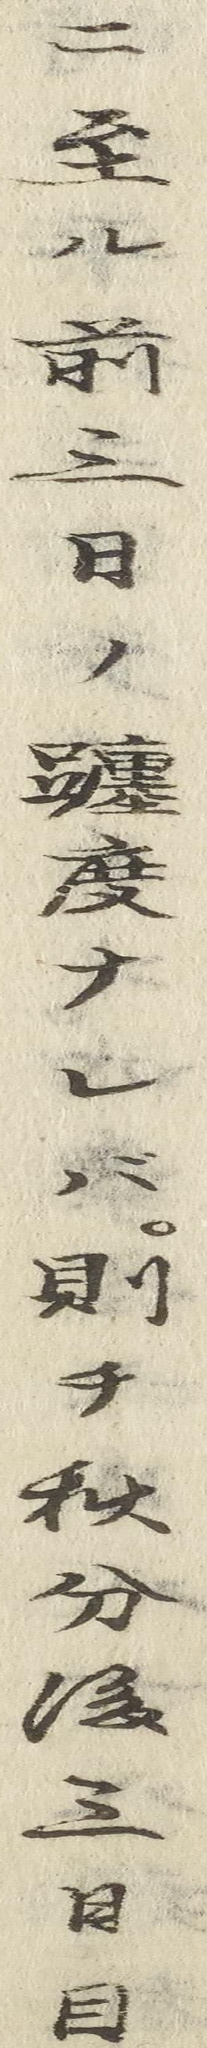ニ至ル前三日ノ躔度ナレバ。則チ秋分後三日目
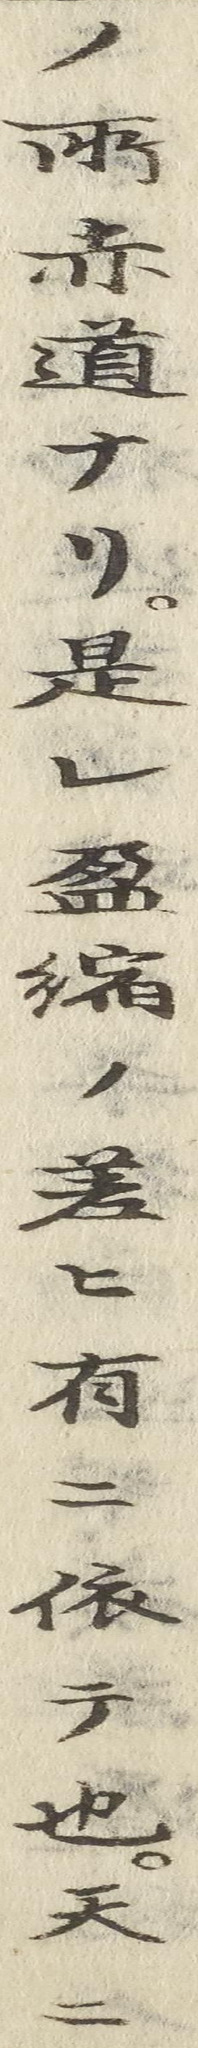ノ所赤道ナリ。是レ盈縮ノ差ヒ有ニ依テ也。天ニ
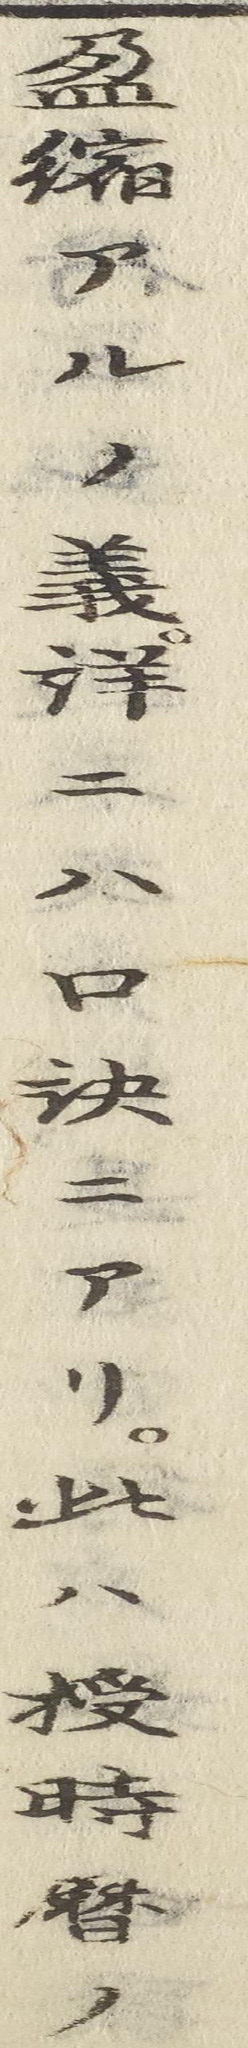盈縮アルノ義。詳ニハ口訣ニアリ。此ハ授時暦ノ
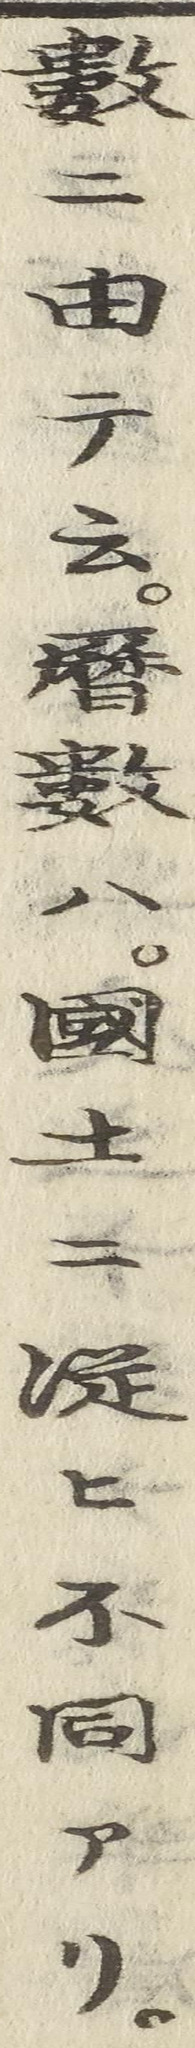数ニ由テ云。暦数ハ。国土ニ従ヒ不同アリ。
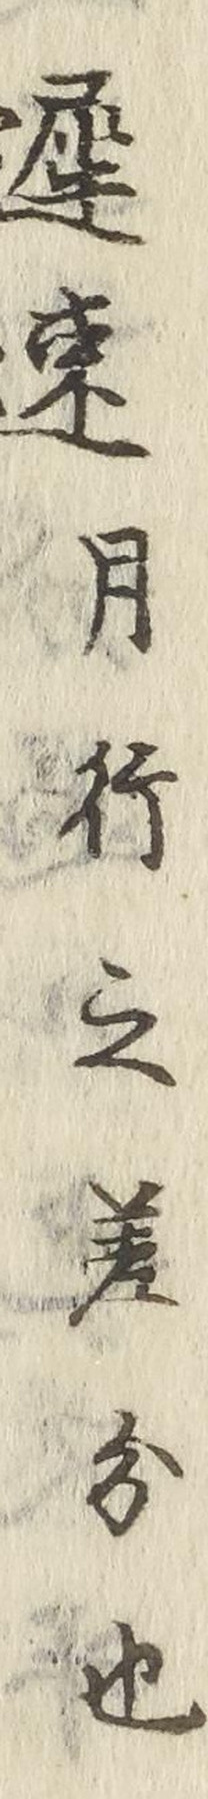遅速月行ノ差分也
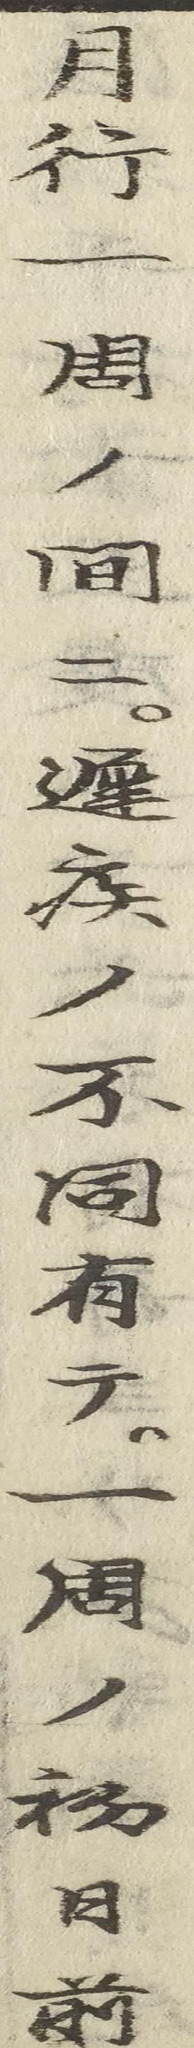月行一周ノ間ニ。遅疾ノ不同有テ。一周ノ初日前

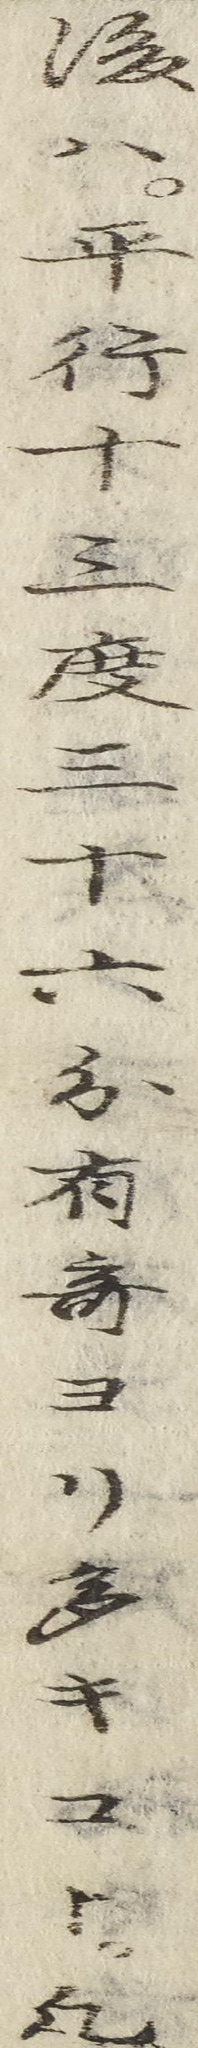後ハ。平行十三度三十六分有奇ヨリ多キコト。凡
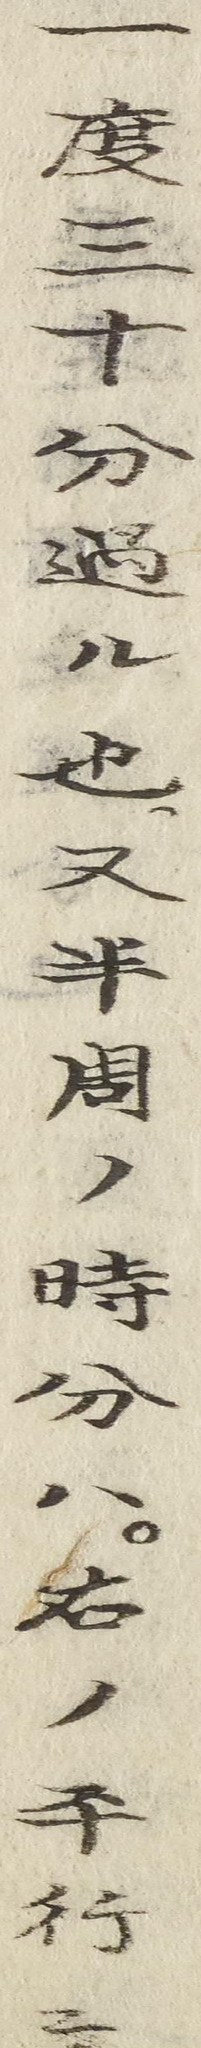一度三十分過ル也。又半周ノ時分ハ。右ノ平行ニ
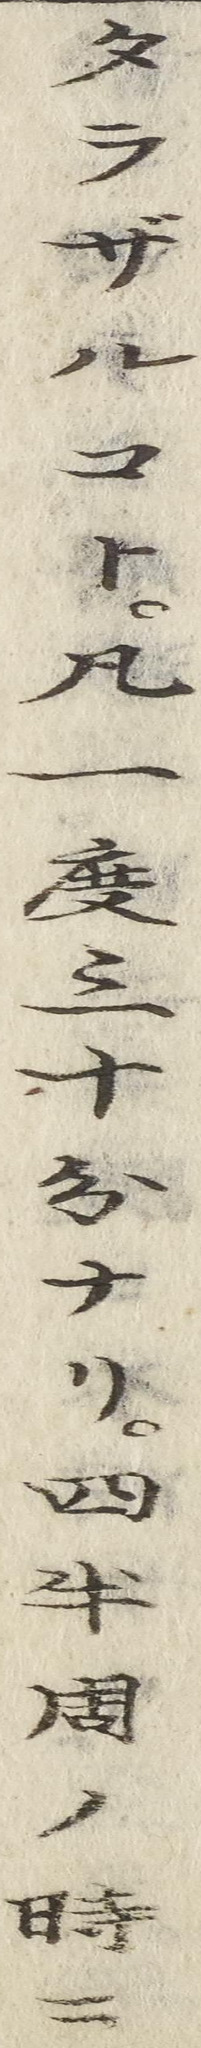タラザルコト。凡一度三十分ナリ。四半周ノ時ニ
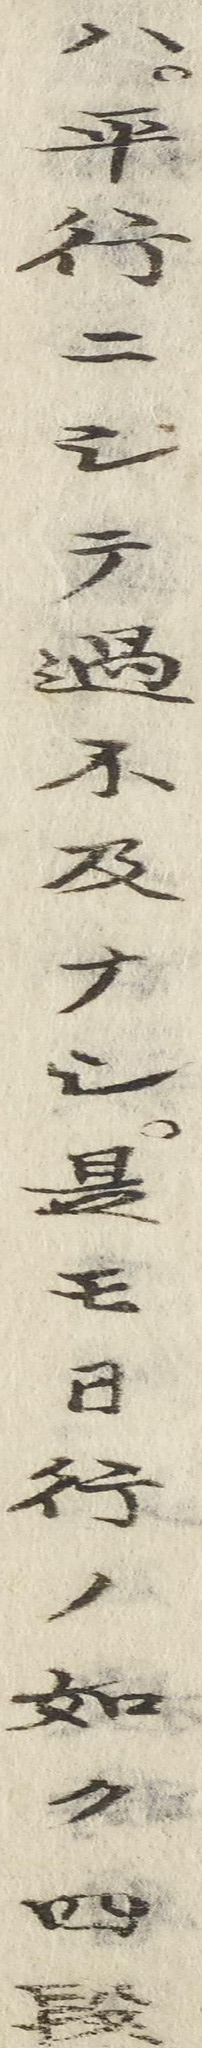ハ。平行ニシテ過不及ナシ。是モ日行ノ如ク四段
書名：大略天学名目鈔　天經或問附録
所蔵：東京大学地震研究所図書室 Earthquake Research Institute Library, The University of Tokyo, JAPAN
